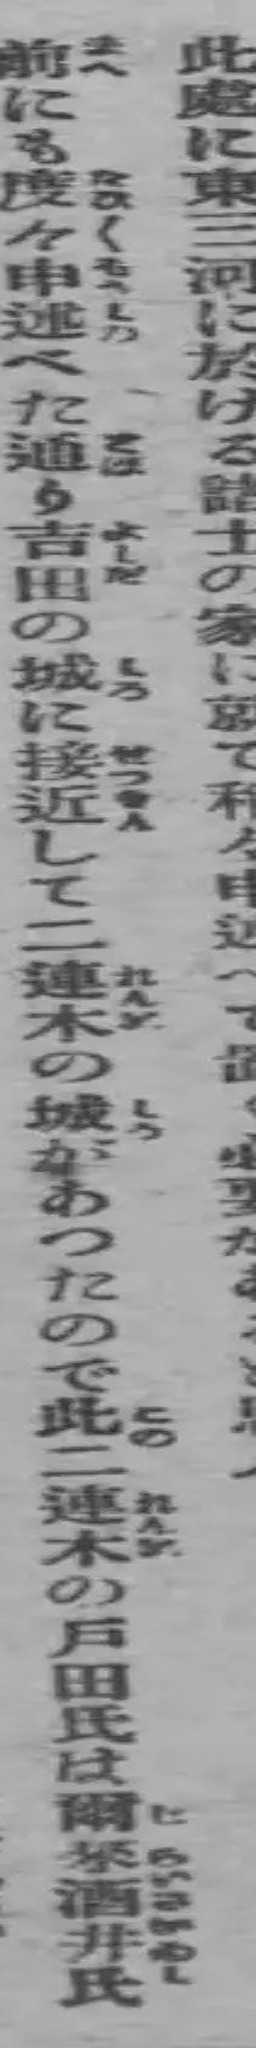戸田忠重前にも度々申述べた通り吉田の城に接近して二連木の城があつたので此二連木の戸田氏は爾来酒井氏
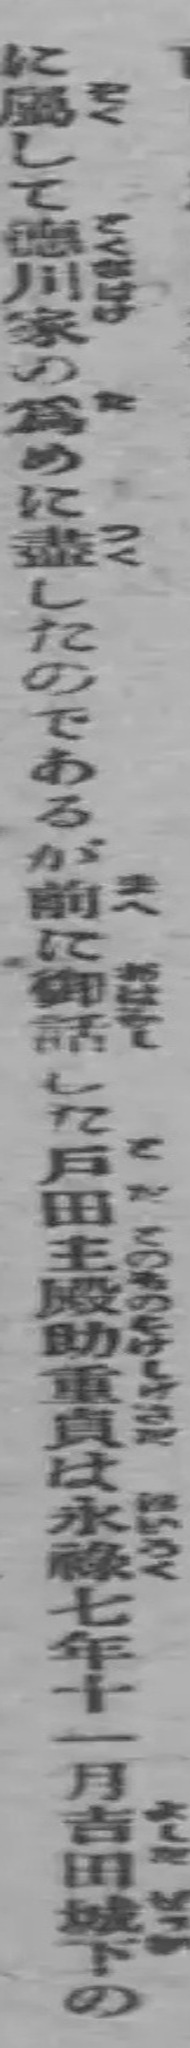に属して徳川家の為めに尽したのであるが前に御話した戸田主殿助重貞は永禄七年十一月吉田城下の

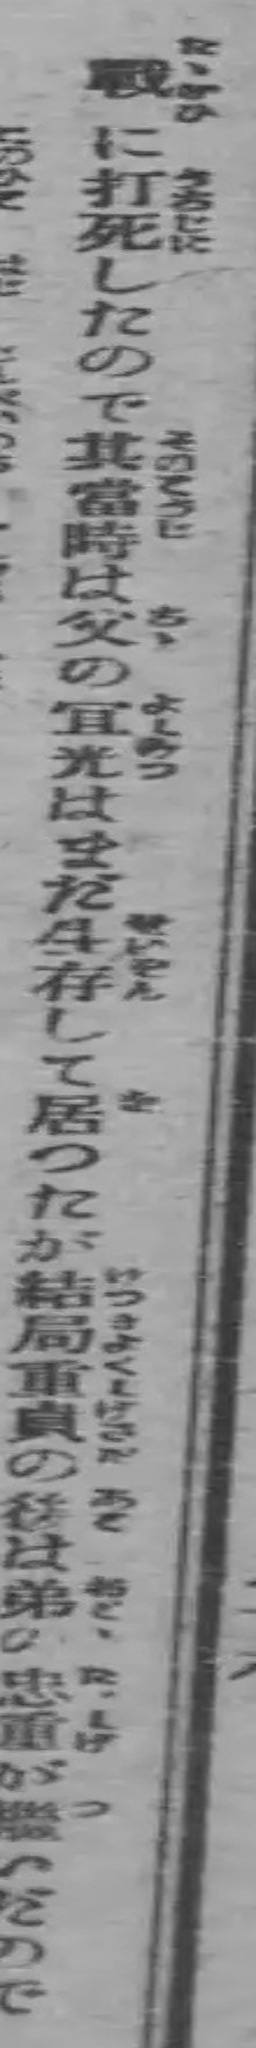戦に打死したので其当時は父の宜光はまだ生存して居つたが結局重貞の後は弟の忠重が継いだので
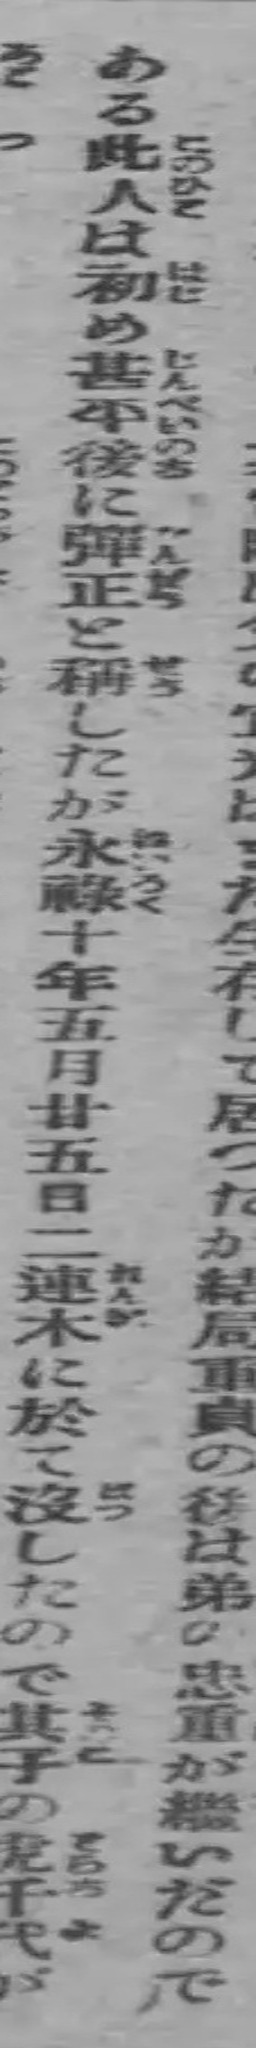ある此人は初め甚平後に弾正と称したが永禄十年五月廿五日二連木に於て没したので其子の虎千代が
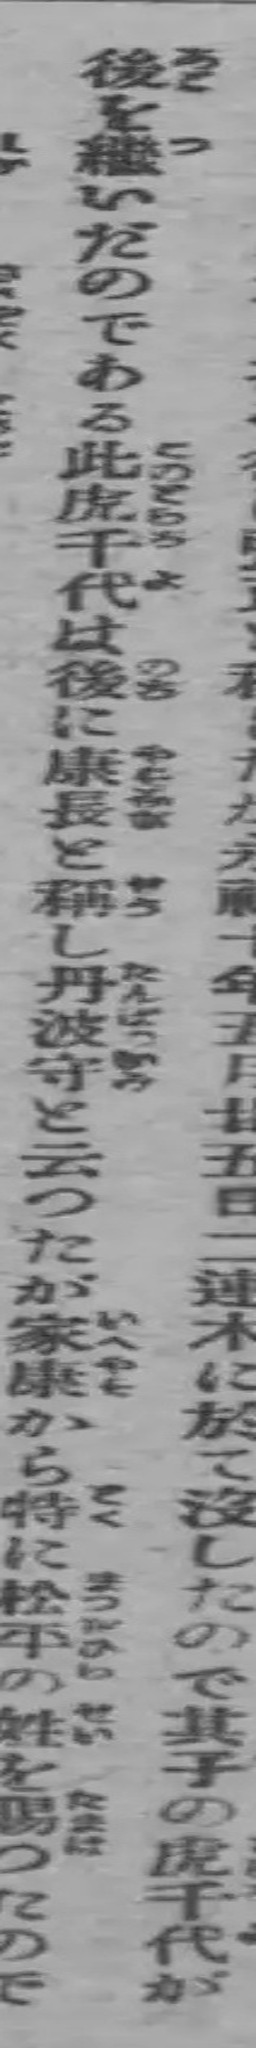戸田康長後を継いだのである此虎千代は後に康長と称し丹波守と云つたが家康から特に松平の姓を賜つたので
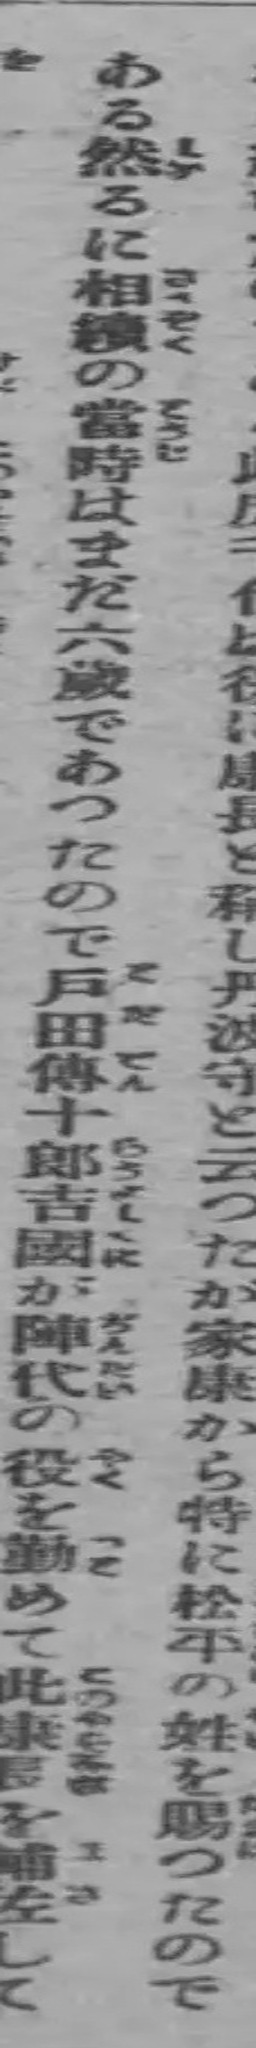ある然るに相続の当時はまだ六歳であつたので戸田伝十郎吉国が陣代の役を勤めて此康長を補佐して
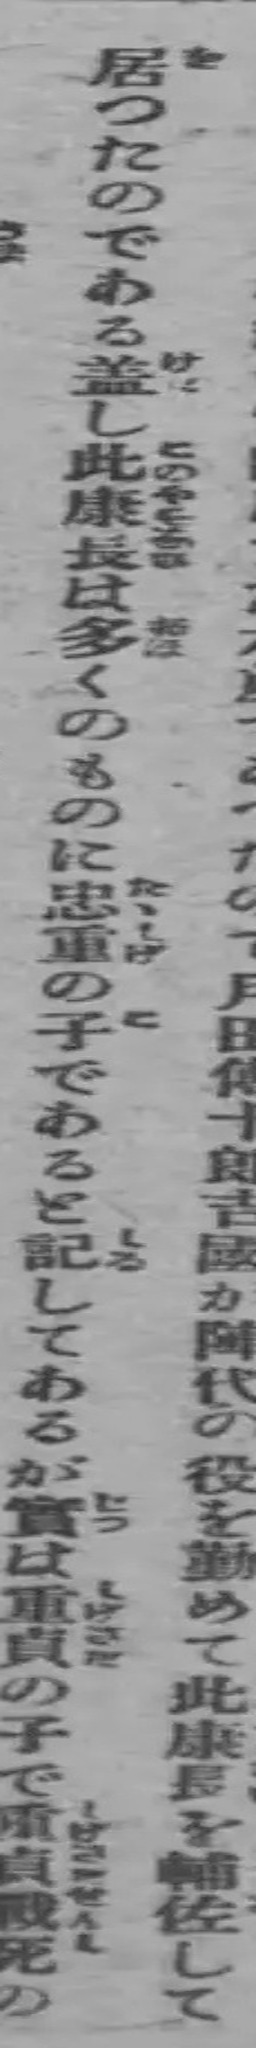居つたのである蓋し此康長は多くのものに忠重の子であると記してあるが実は重貞の子で重貞戦死の
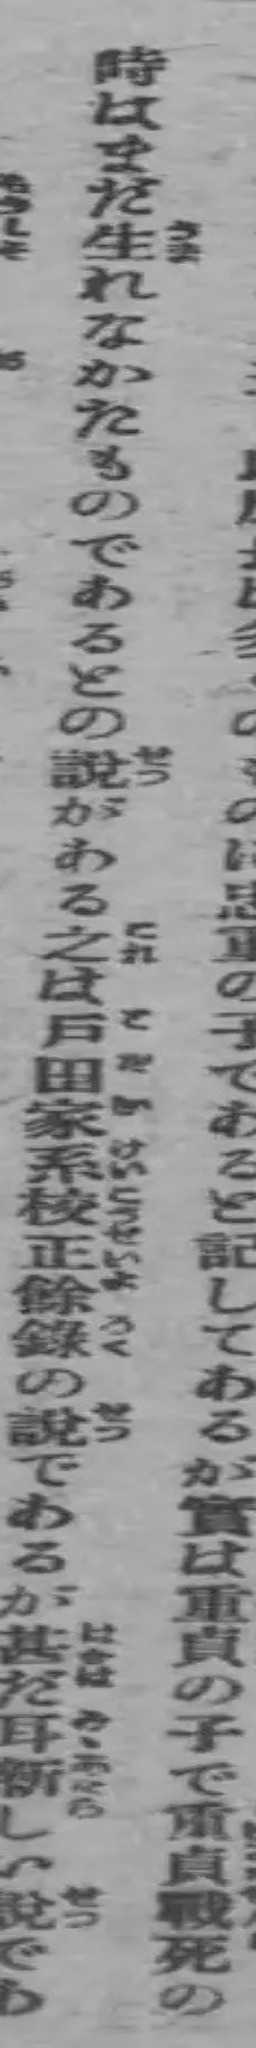時はまだ生れなかつたものであるとの説がある之は戸田家系校正余録の説であるが甚だ耳新しい説であ
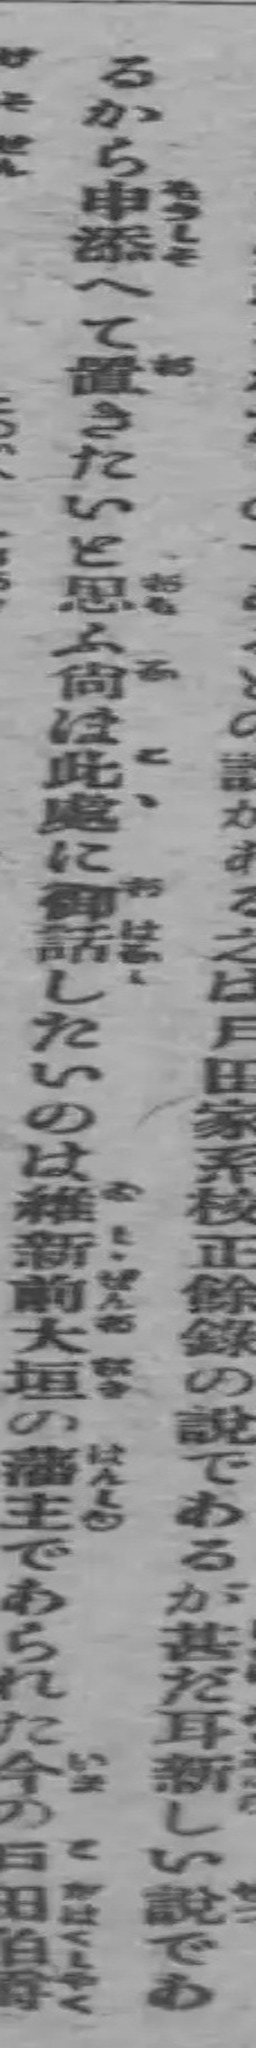るから申添へて置きたいと思ふ尚ほ此処に御話したいのは維新前大垣の藩主であられた今の戸田伯爵
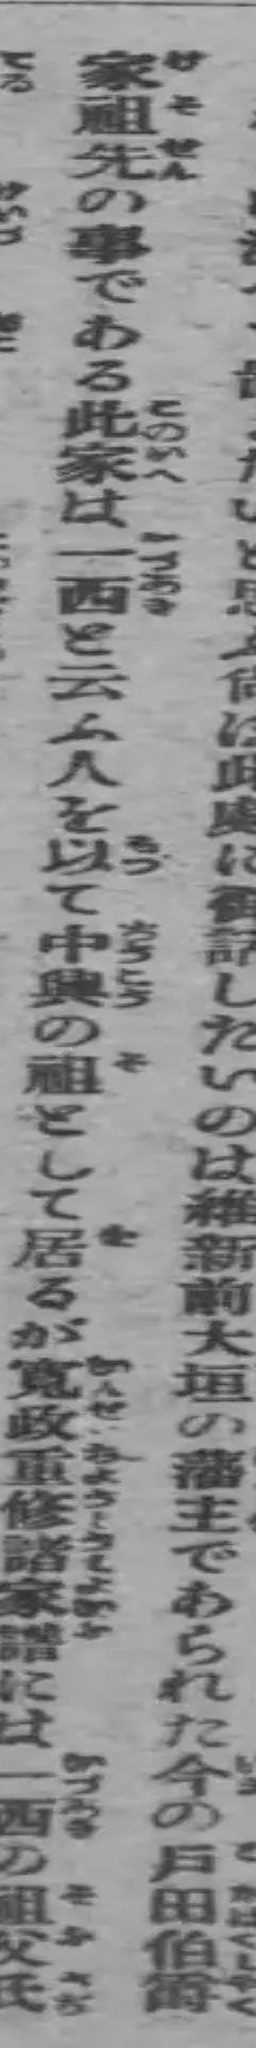家祖先の事である此家は一西と云ふ人を以て中興の祖として居るが寛政重修諸家譜には一西の祖父氏
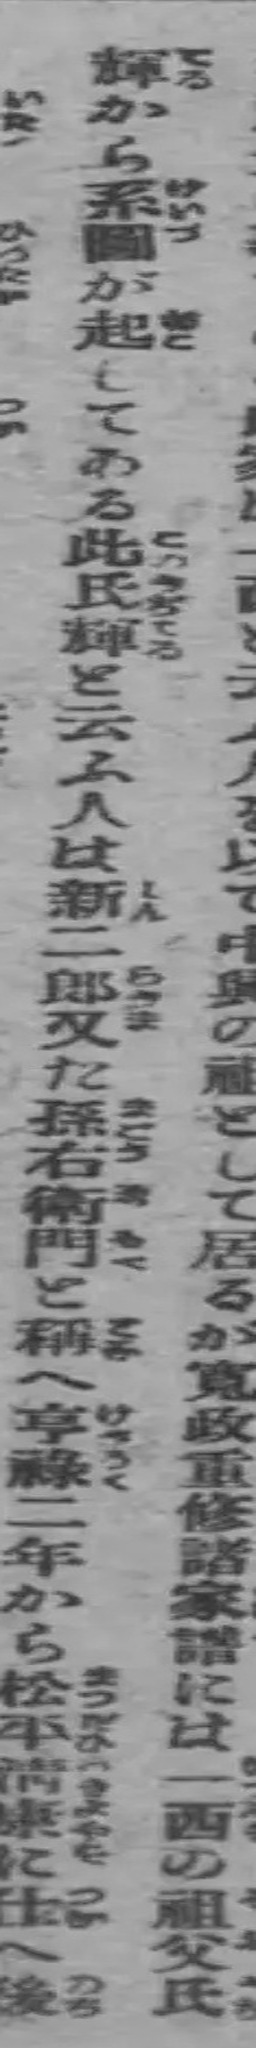戸田氏輝輝から系図が起してある此氏輝と云ふ人は新二郎又た孫右衛門と称へ享禄二年から松平清康に仕へ後
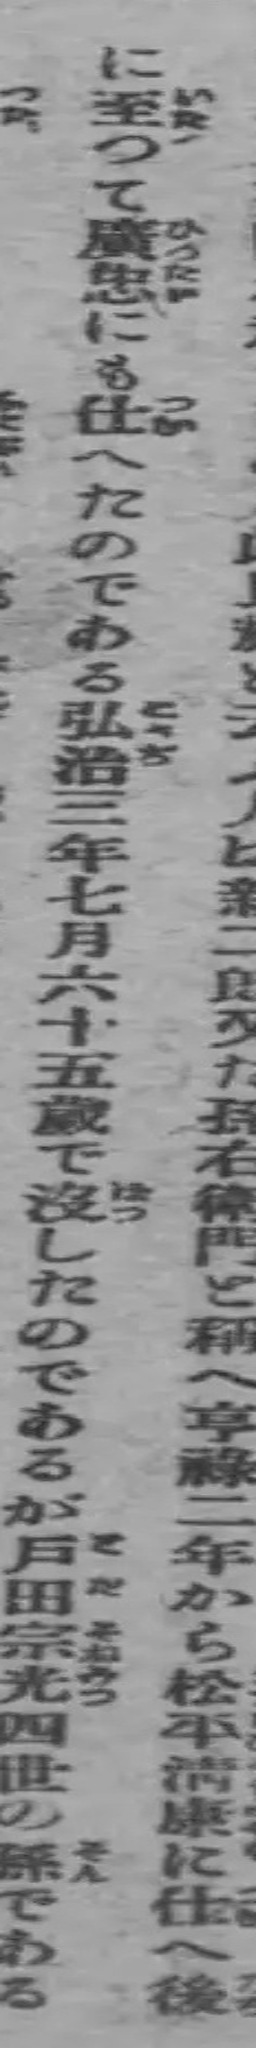に至つて広忠にも仕へたのである弘治三年七月六十五歳で没したのであるが戸田宗光四世の孫である
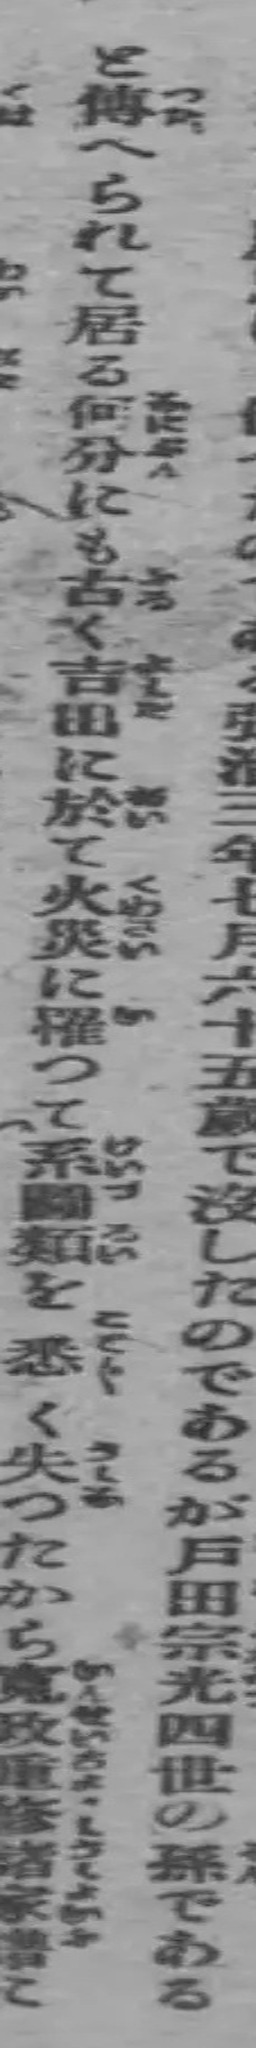と伝えへられて居る何分にも古く吉田に於て火災に罹つて系図類を悉く失つたから寛政重修諸家譜に
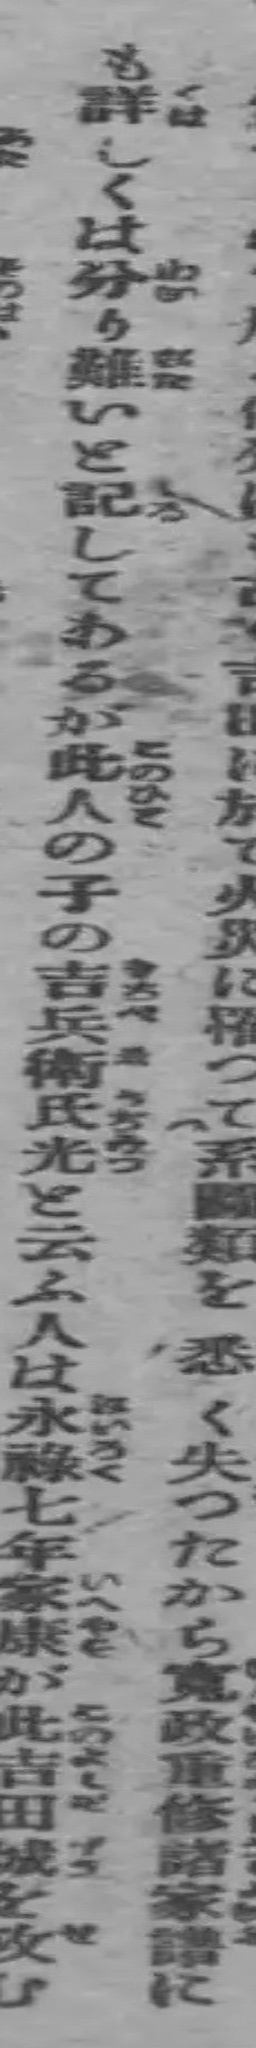戸田氏光も詳しく分り難いと記してあるが此人の子の吉兵衛氏光と云ふ人は永禄七年家康が此吉田城を攻む
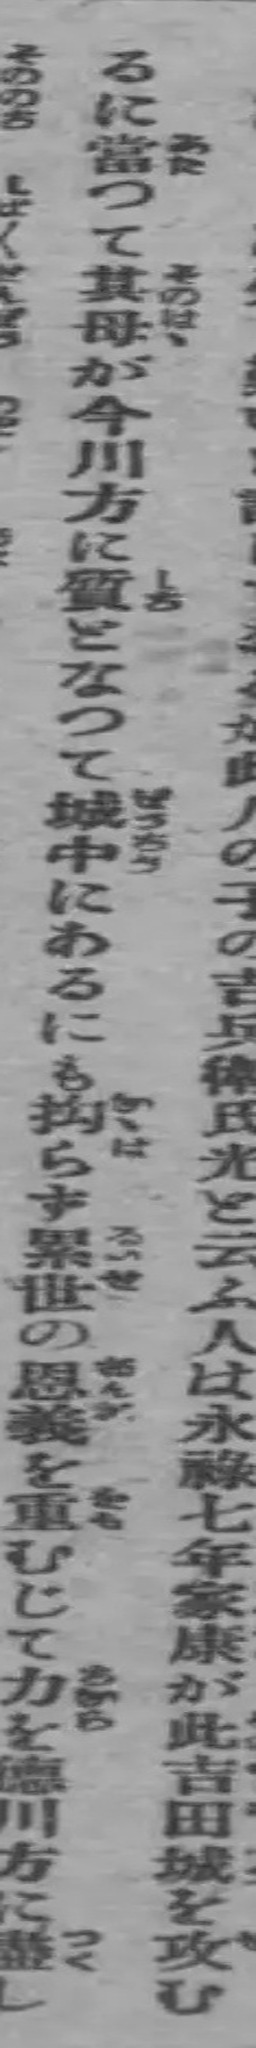るに当つて其母が今川方に質となつて城中にあるにも拘らず累世の恩義を重むじて力を徳川方に尽し
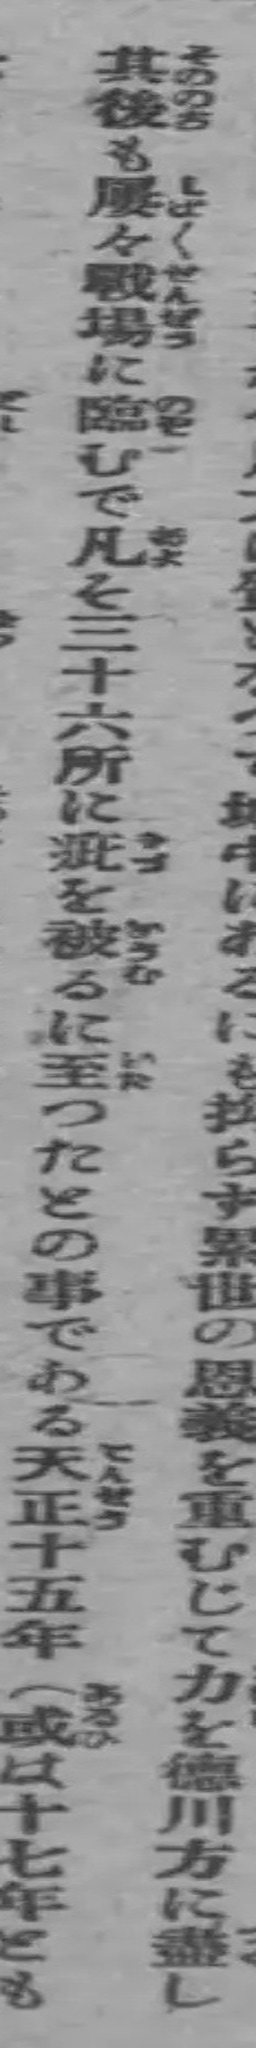其後も屡々戦場に臨むで凡そ三十六所に疵を被るに至つたとの事である天正十五年(或は十七年とも
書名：豊橋市史談
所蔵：国立国会図書館 National Diet Library, JAPAN
